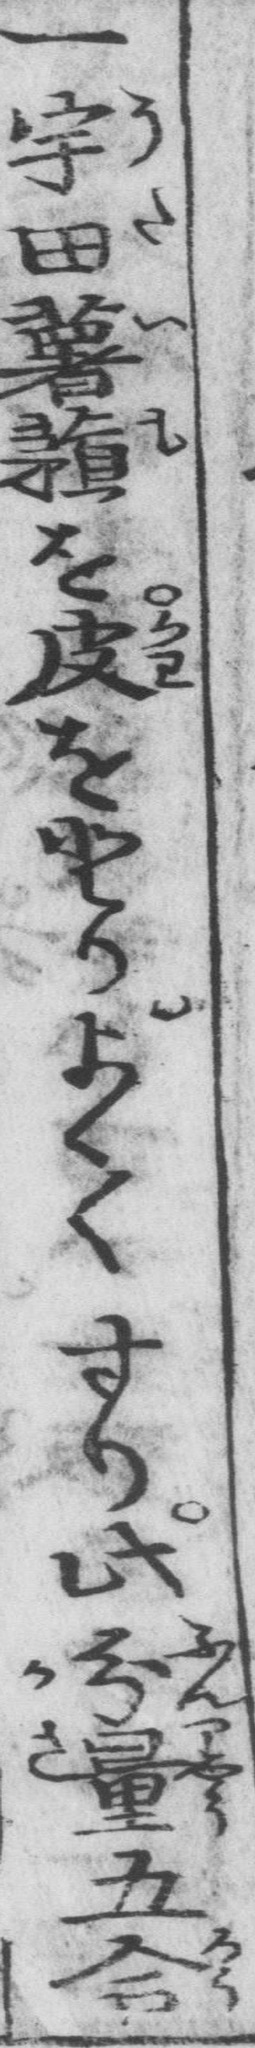一宇田薯蕷を。皮をとり。よく〳〵すり。此分量五合
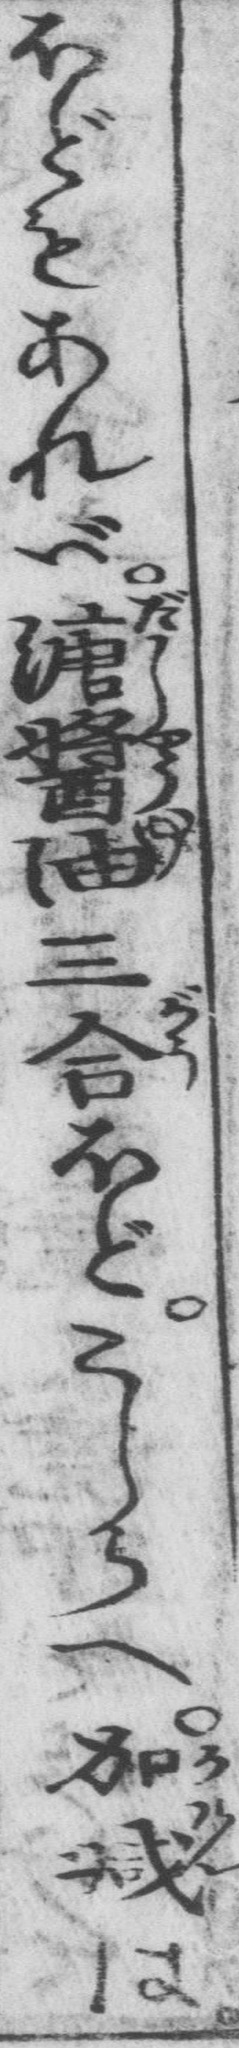ほどもあれば。溏醤油三合ほど。こしらへ。加減は。
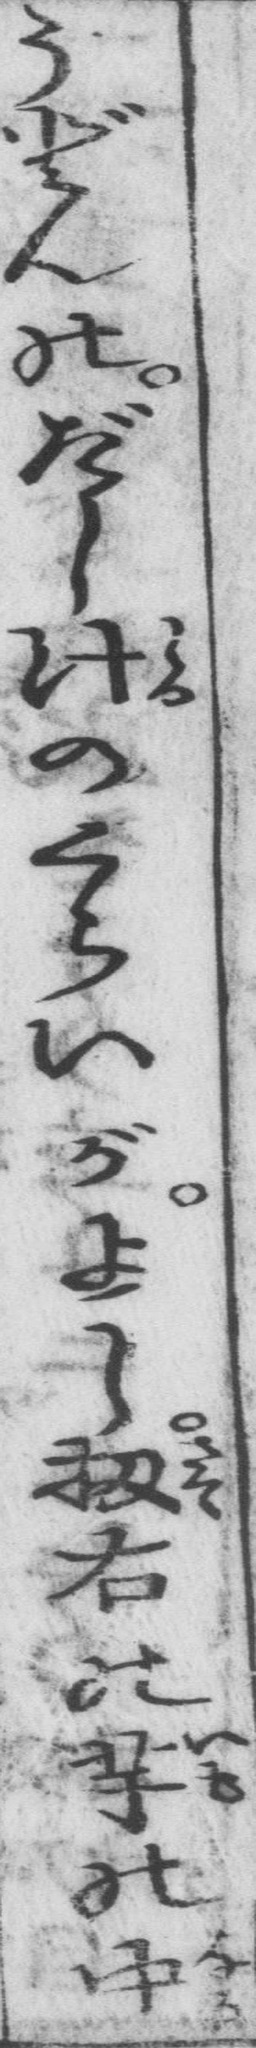うどんの。だし汁のくらいが。よし。扨右の芋の中
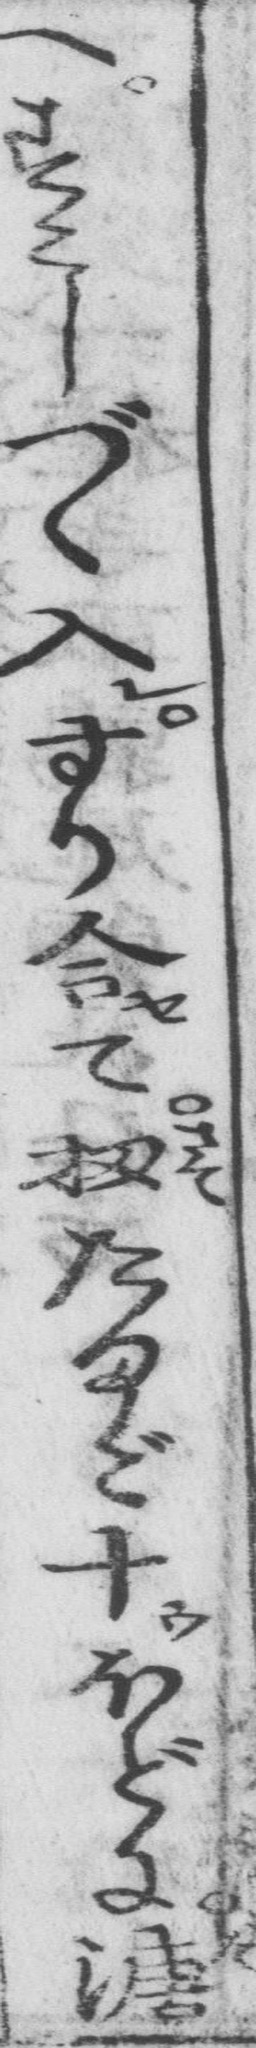へ。すこしづゝ入れ。すり合せて。扨たまご十ウほどに。溏
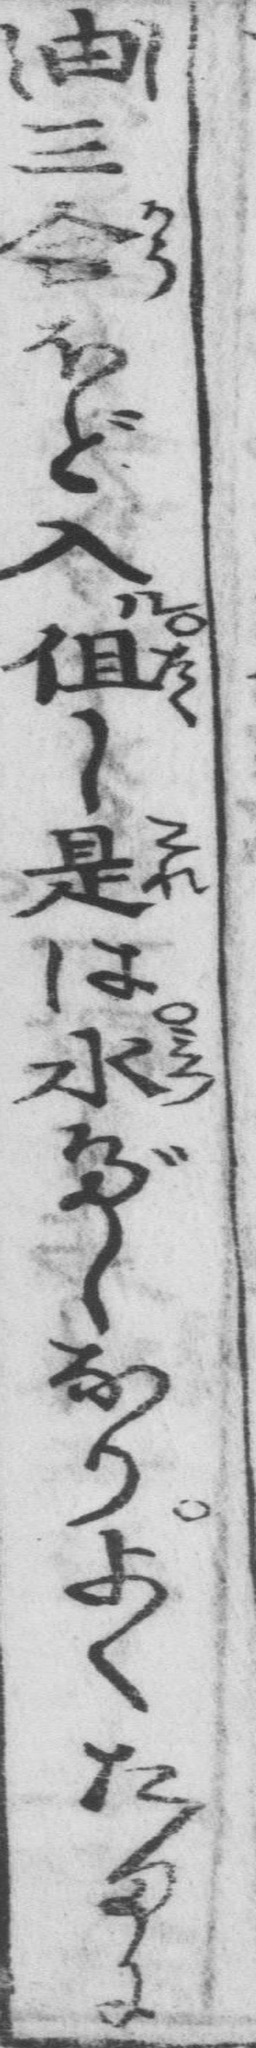油三合ほど入る。但し是は。水だしなり。よくたまに
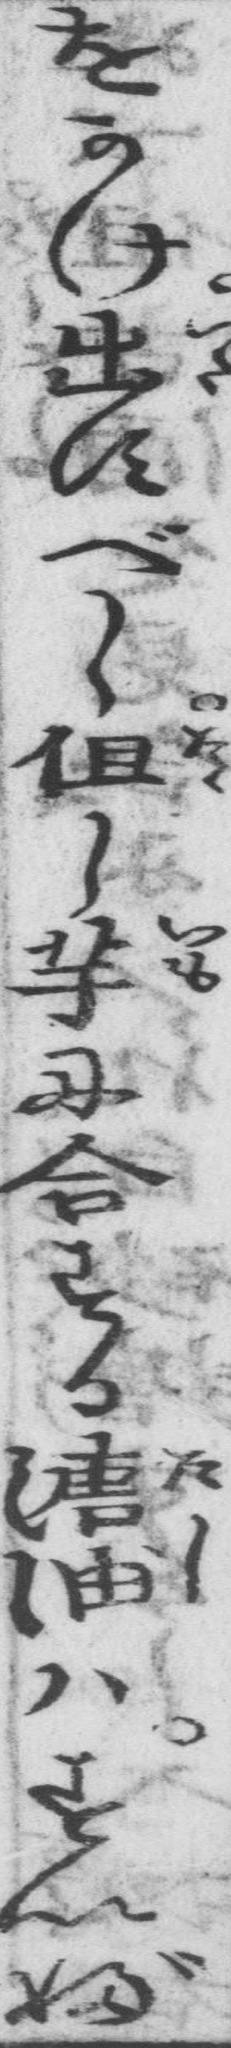をかけ。出すべし。但し芋に合する溏油は。すいぶ
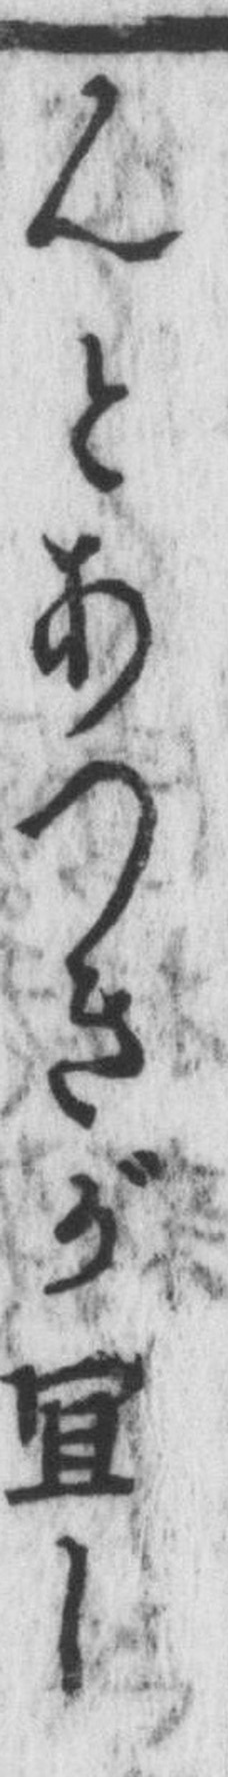んとあつきが宜し
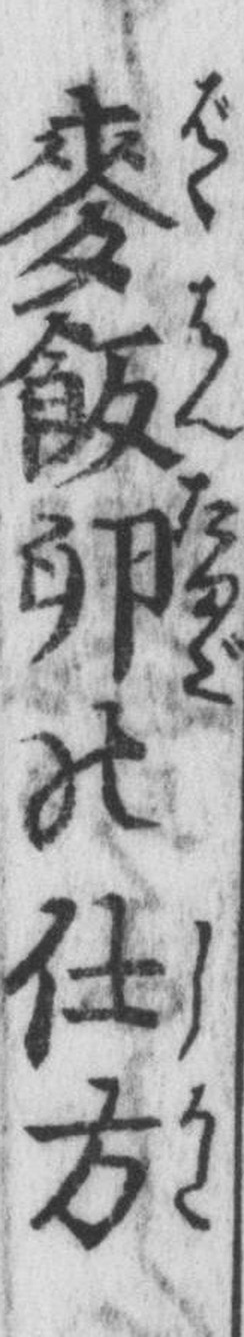麦飯卵の仕方
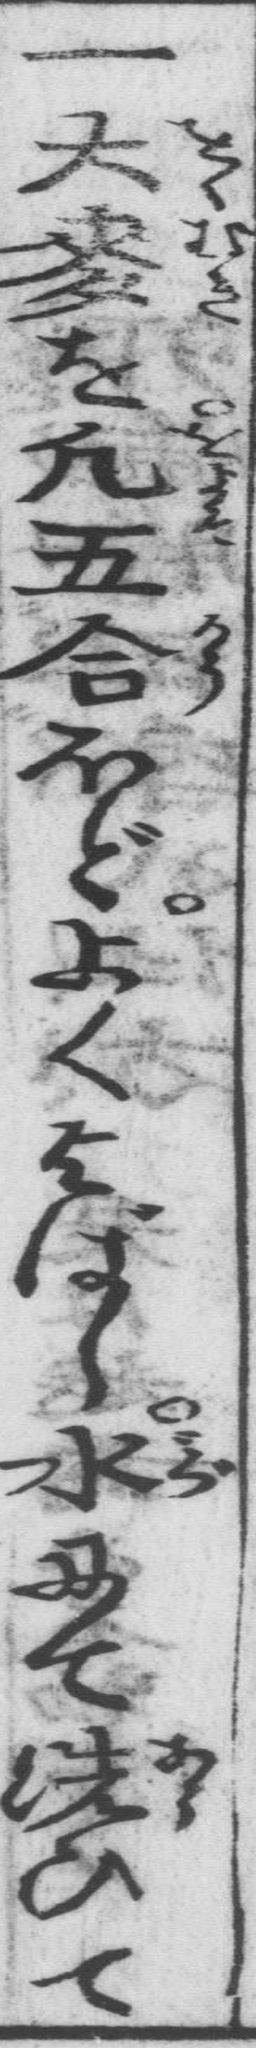一大麦を。凡五合ほど。よくよばし。水にて洗ひて
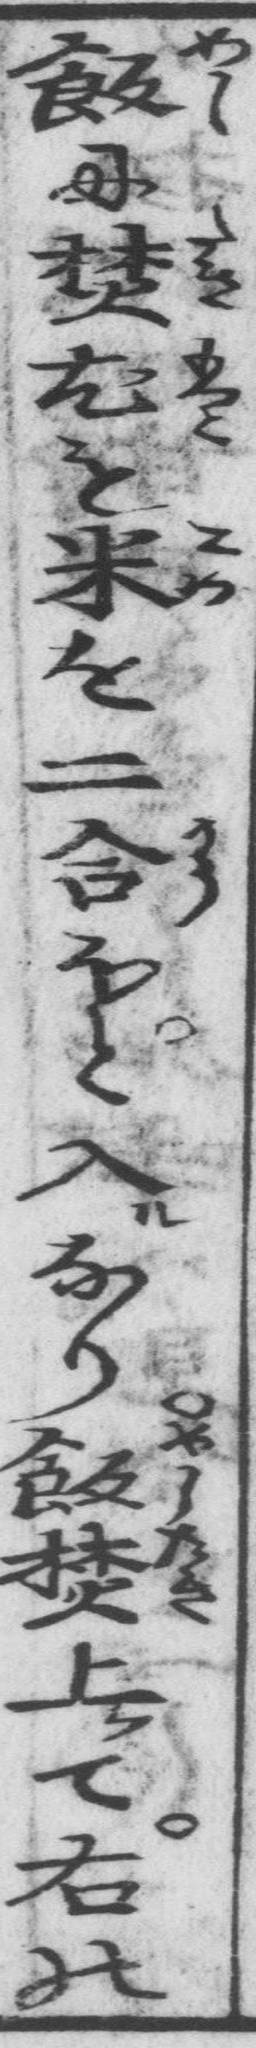飯に焚尤も米を二合ほど入るなり。飯焚上けて。右の
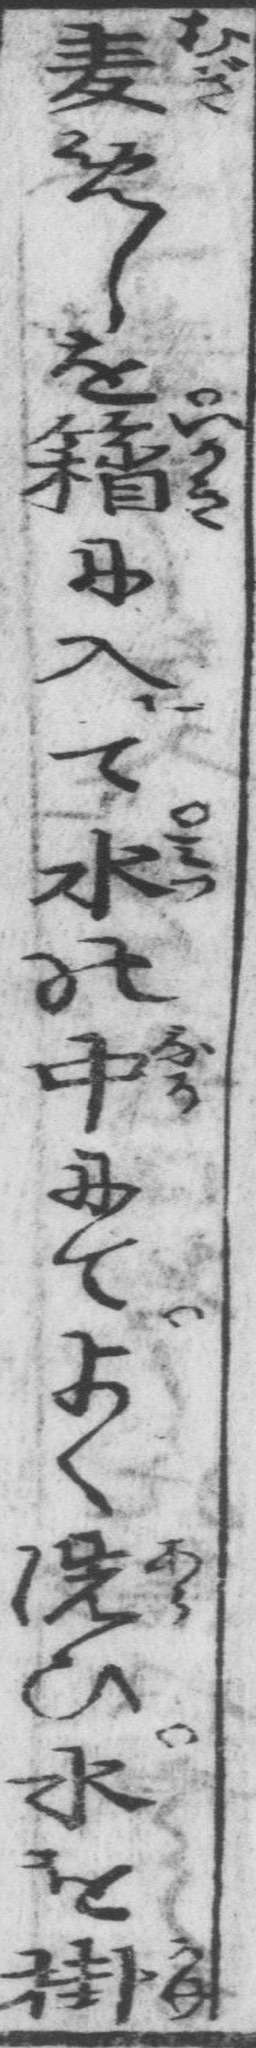麦めしを。䈾に入れて。水の中にて。よく洗ひ。水を掛
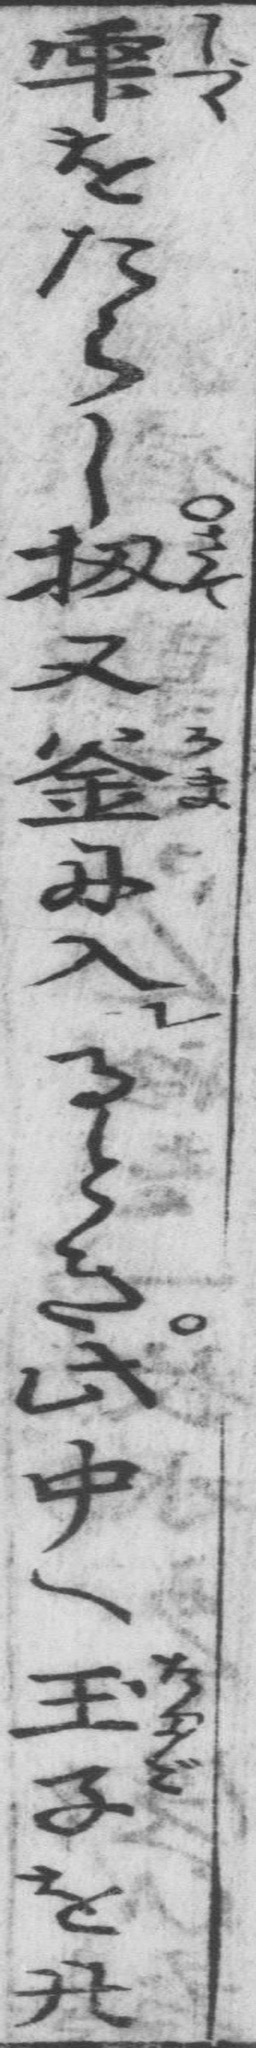雫をたらし。扨又釜に入れるとき。此中へ玉子を廿
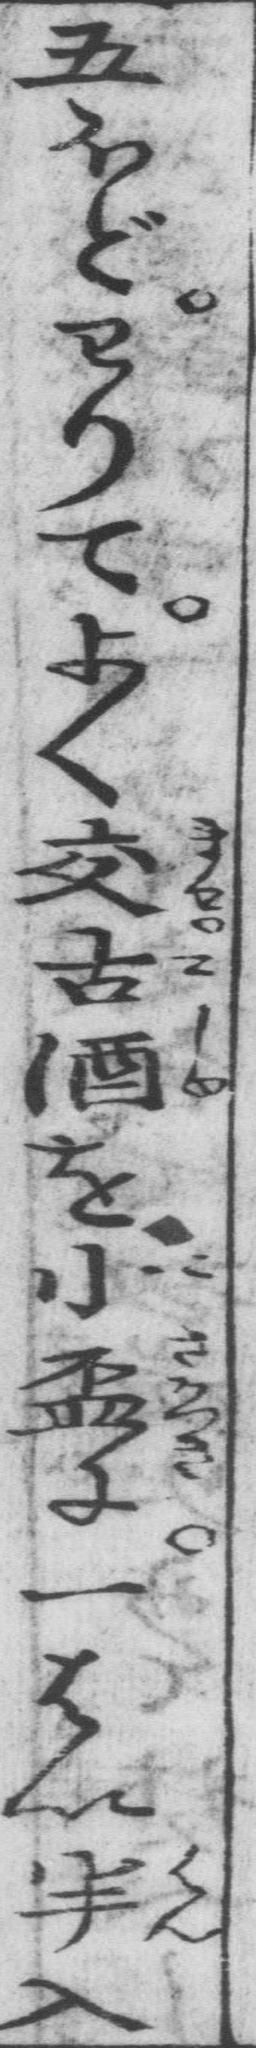五ほど。わりて。よく交。古酒を小盃に。一はい半入

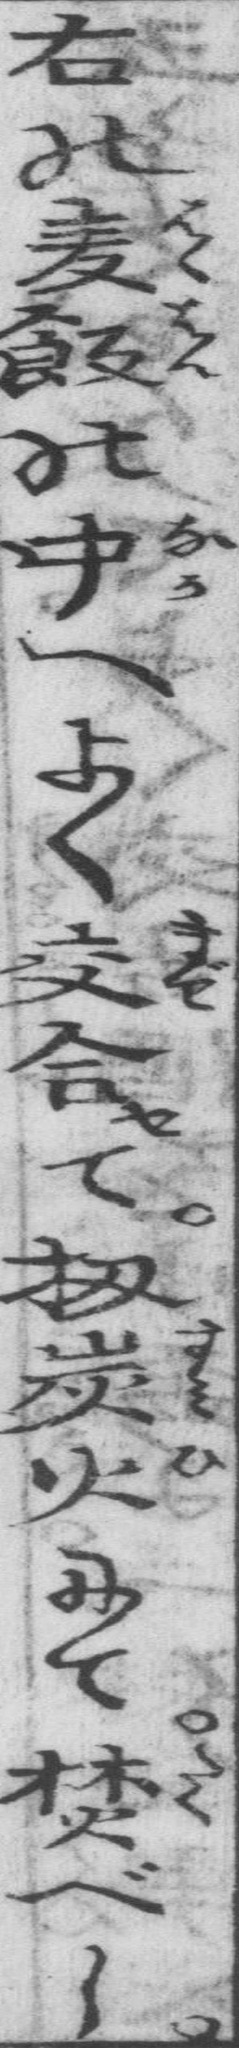右の麦飯の中へよく交合せて。扨炭火にて。焚べし。
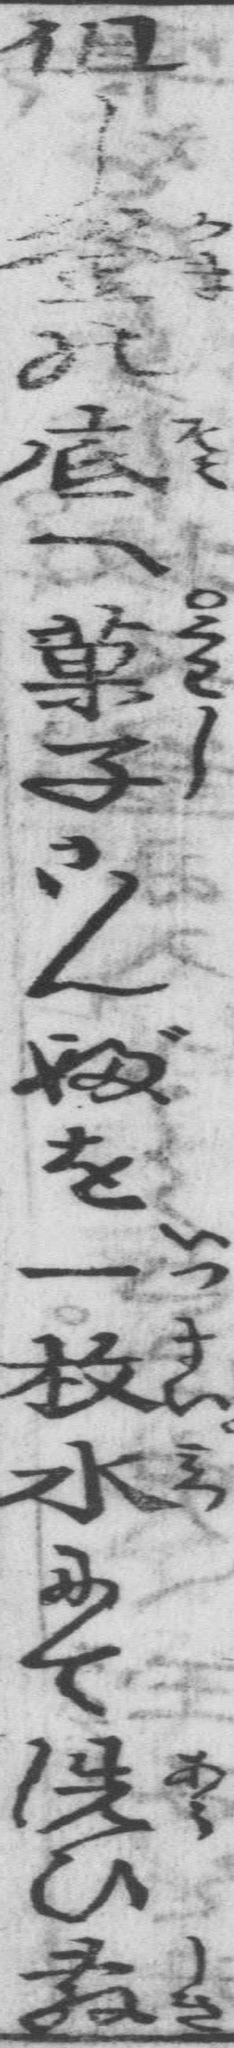但し釜の底へ。菓子こんぶを一枚。水にて洗ひ敷
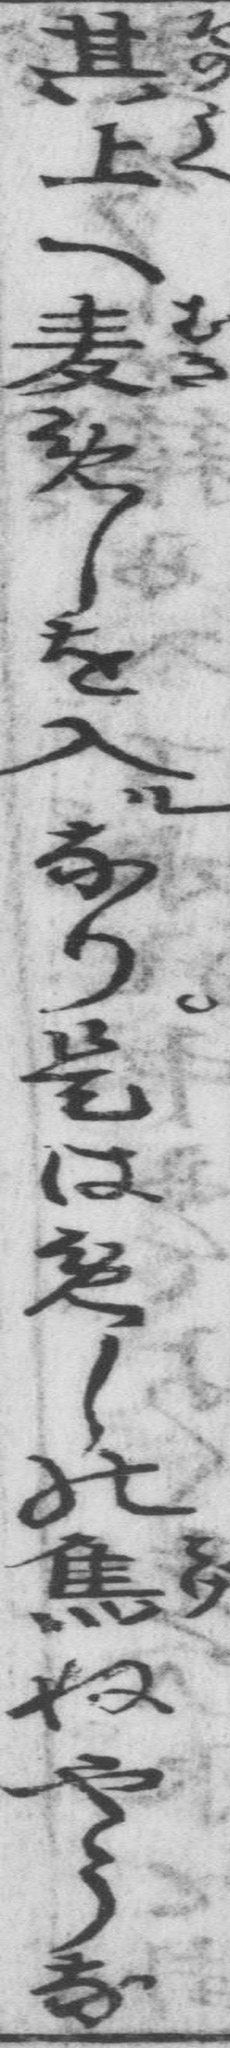其上へ麦めしを入るなり。是は、めしの焦ぬやうな
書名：萬寳料理秘密箱
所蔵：大阪府立大学学術情報センター 国文学研究資料館
